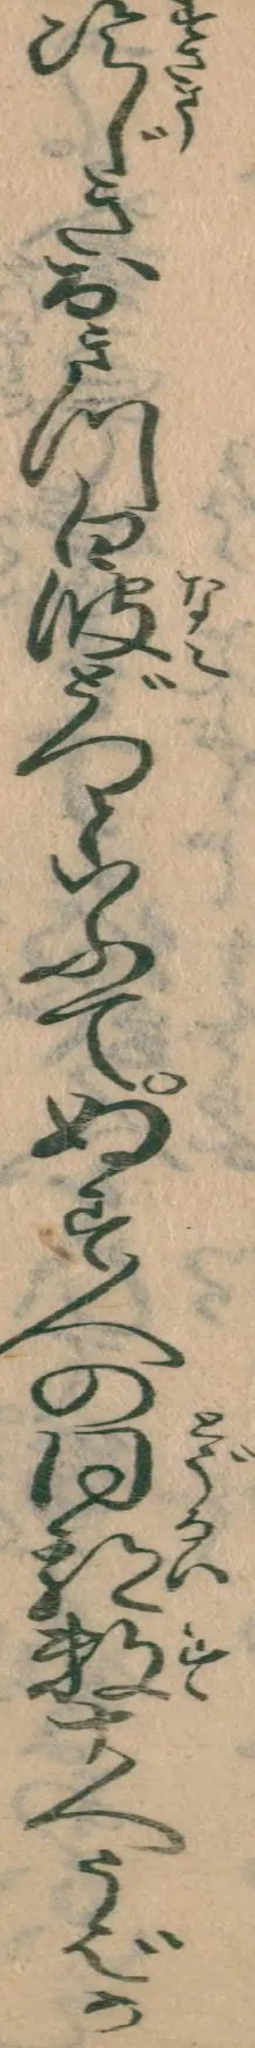凄じきおきつ白波どつといふて。ぬす人の同類数十人うばか
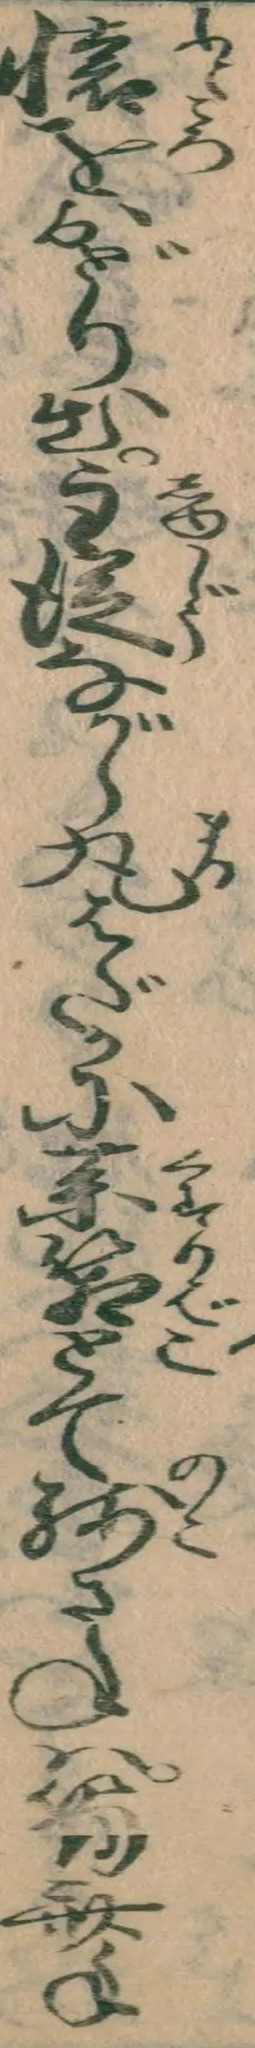懐をおどり出。主従ながら丸はだかに薬箱とて残さねは。筍斎手
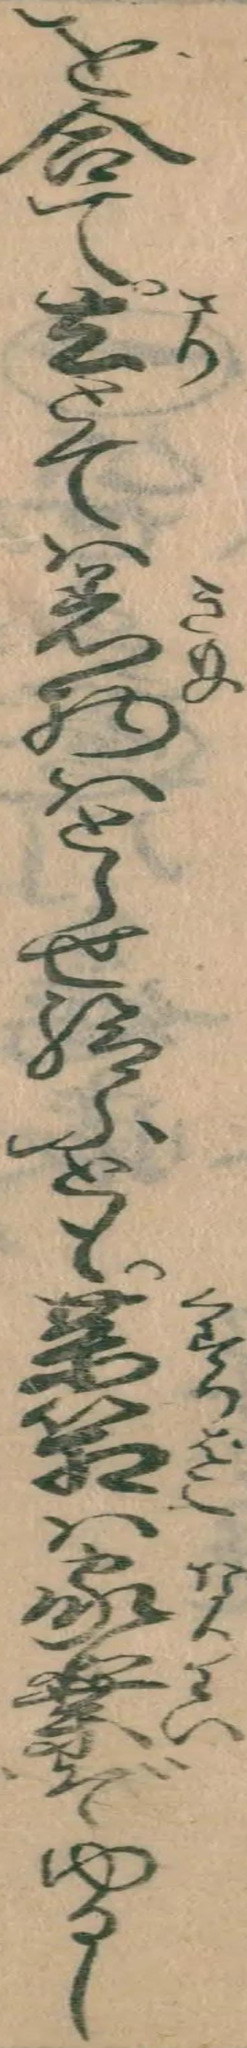を合て。去とては着物はとらせ給ふとも。薬箱は家業ぞゆるし
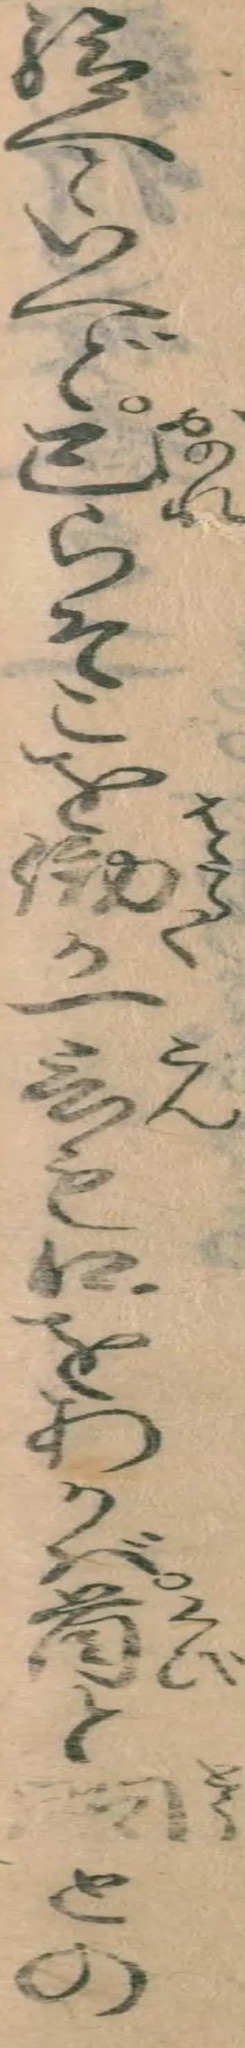給へといへど。己らそこを働か一言も口をあかば。首と胴との
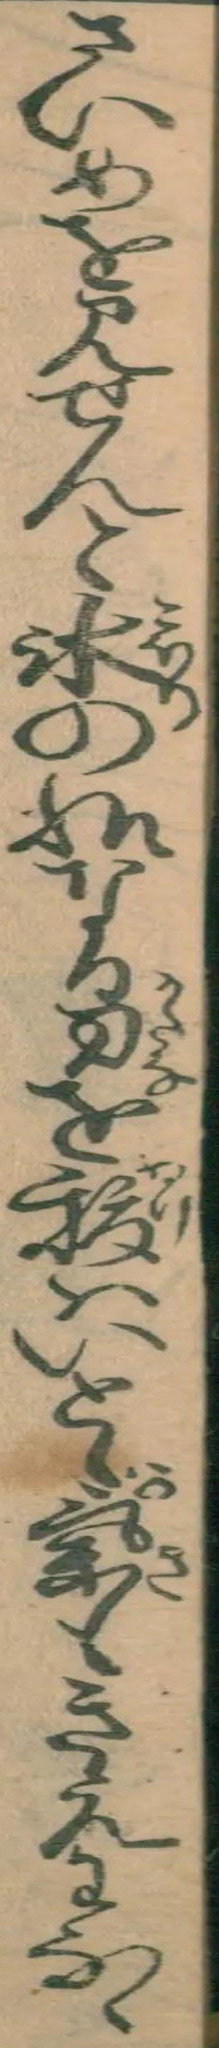さいめを見せんと氷の様なる刀を抜はいとゞ。気もきえわなゝ
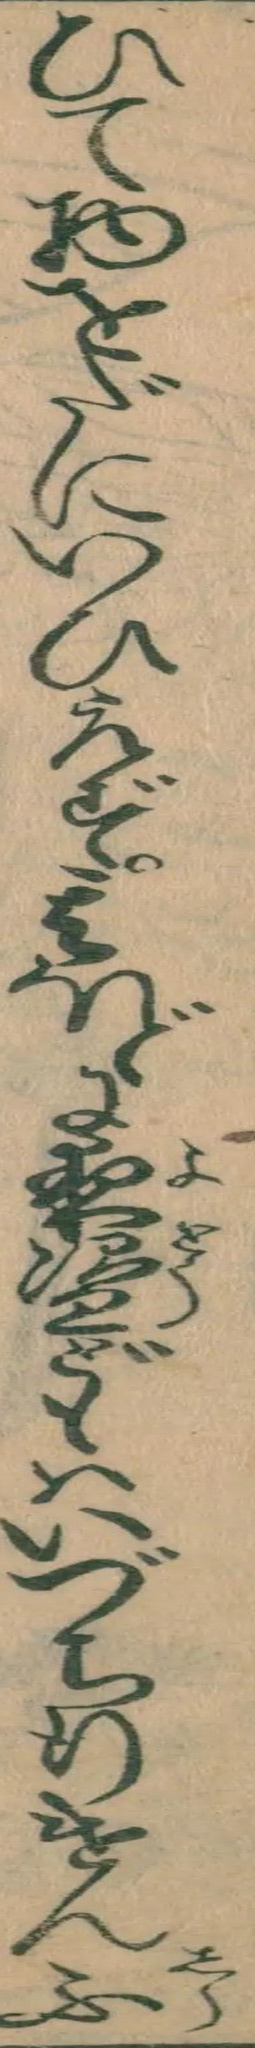ひて物をだにいひえず。其ほどに夜盗どもはいづち行けん不
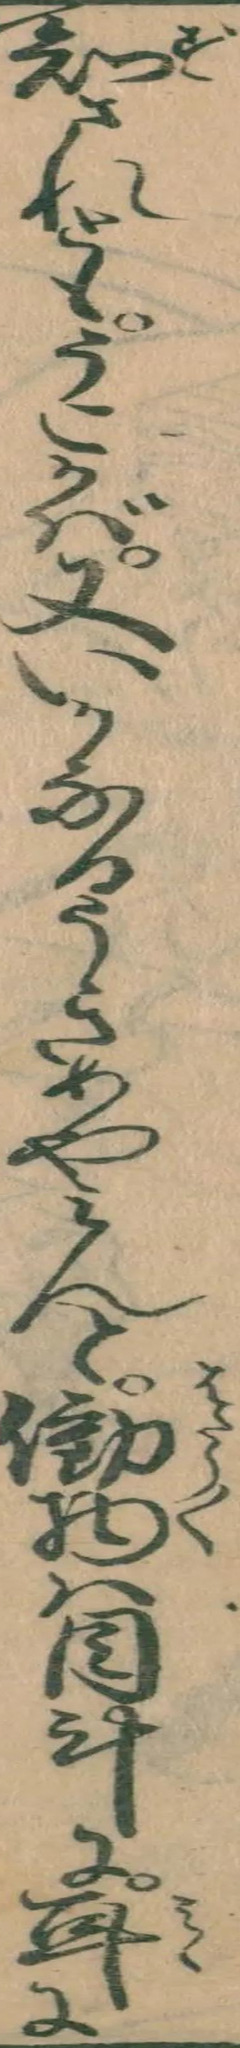知されとも。うこかば。又いかなるうきめやみんと。働物は目。斗に。耳に
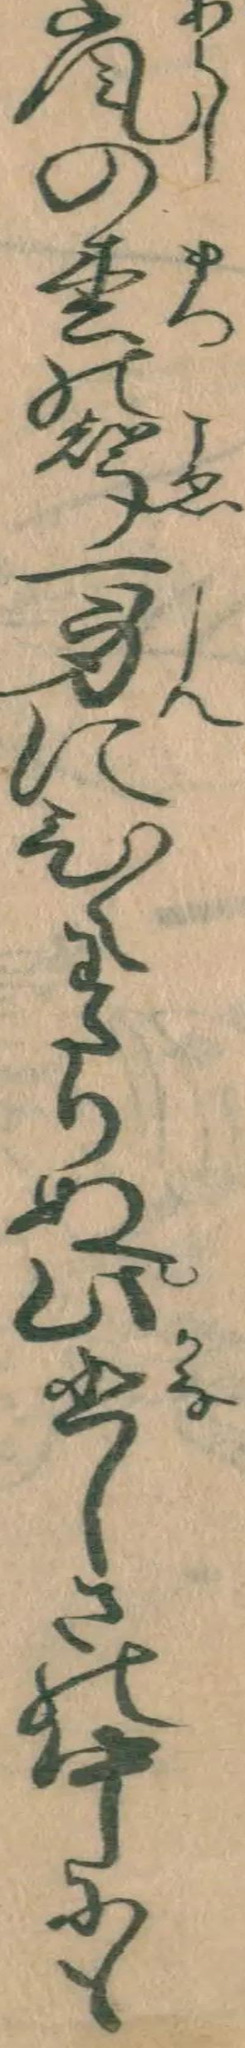嵐の松の声一身にひえわたりぬ。此悲しさの中にも
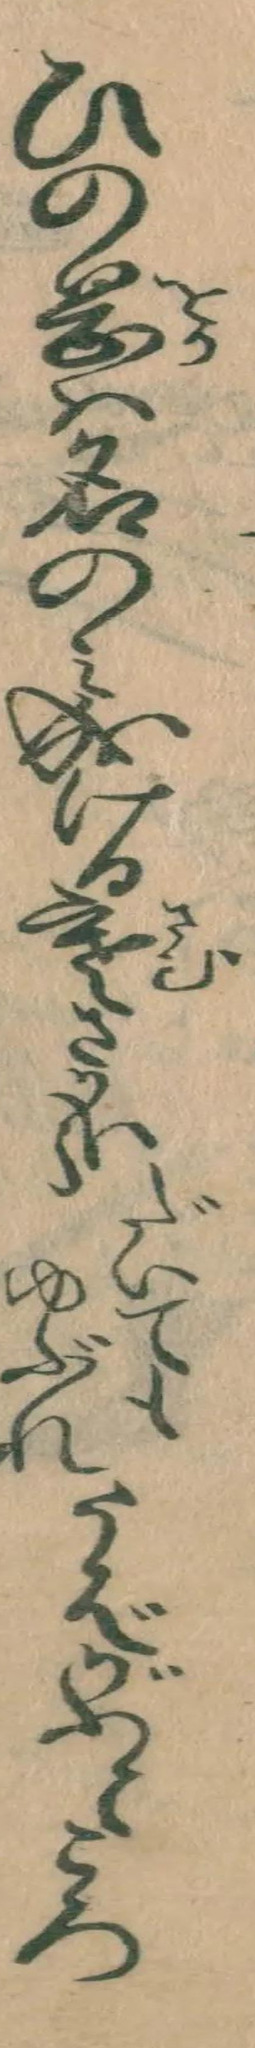ひの岡は名のみ成ける寒さか哉だいてもゆぶれうばがふところ
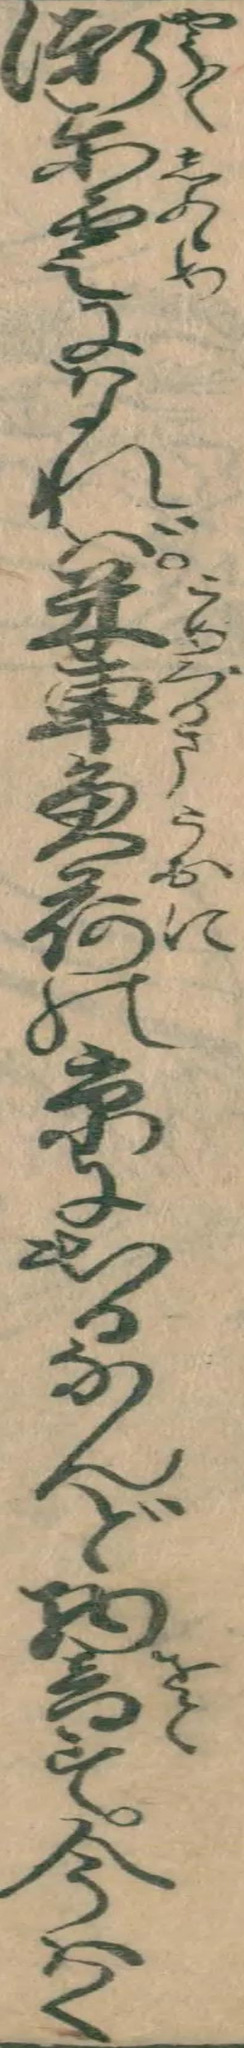漸東雲になれば。米車魚荷の京に出るなんど物音す。今はく
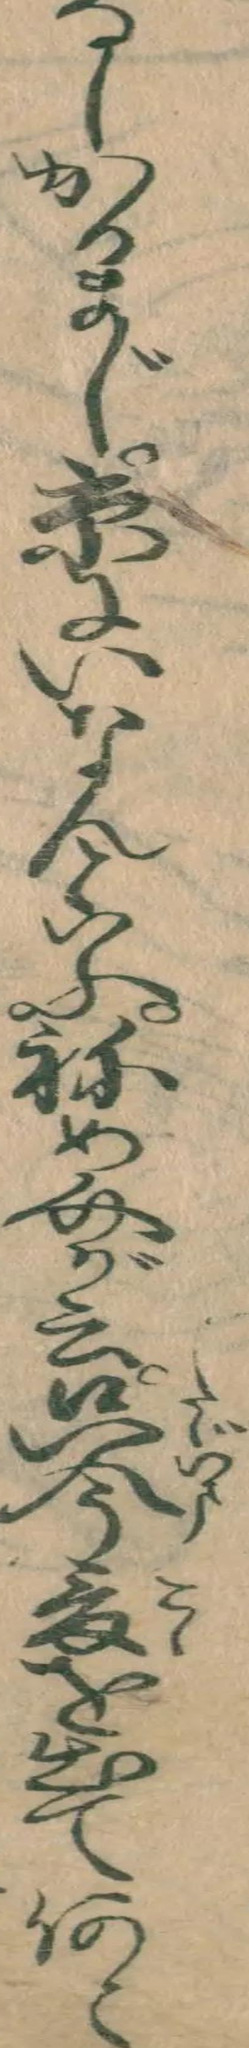るしかるまじ。京にいなんといふ。ねめ介が云。只今爰を出て何と
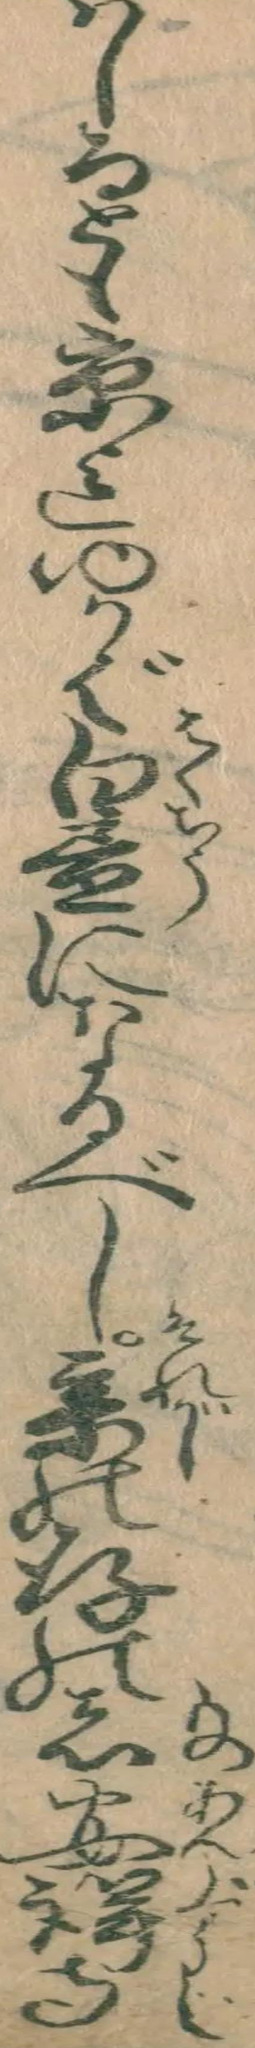はしるとも京迄ゆかば白昼になるべし。某の存の者安祥寺
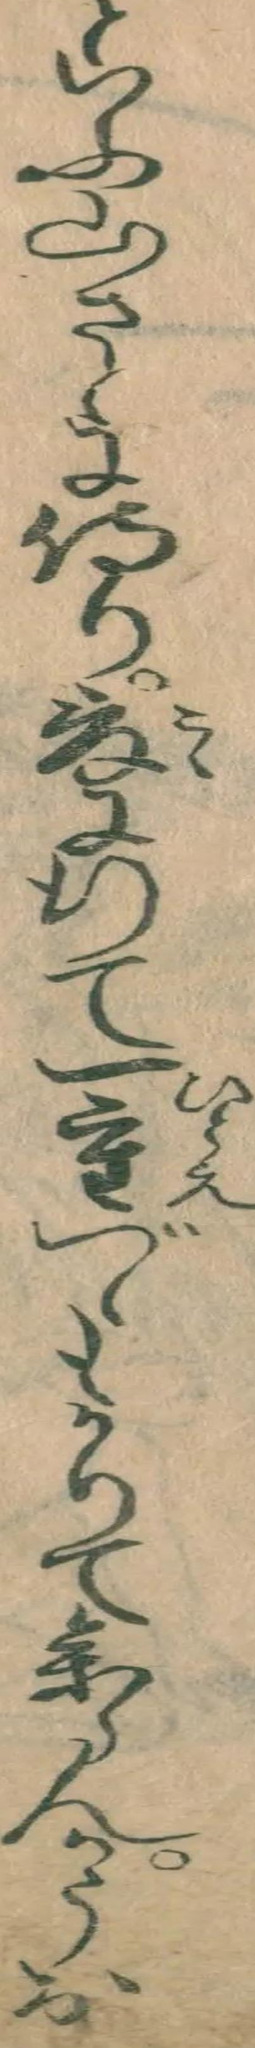といふ山さとに侍り。爰に行て一重づゝもかりて参らん。かうお
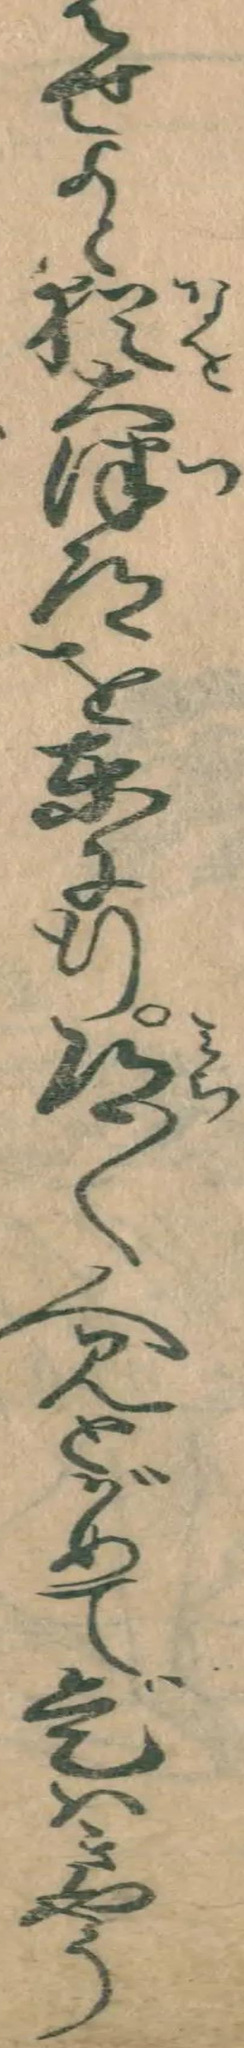はせよと猶大津道を東に行。道々人みとがめて。是はきやう
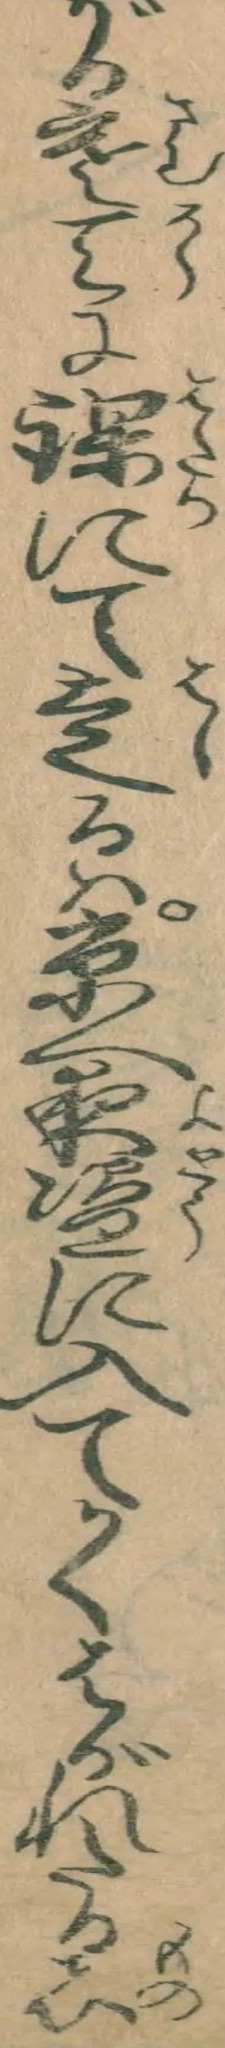がる寒天に裸にて走るは。京へ夜盗に入てかくはがれたる者

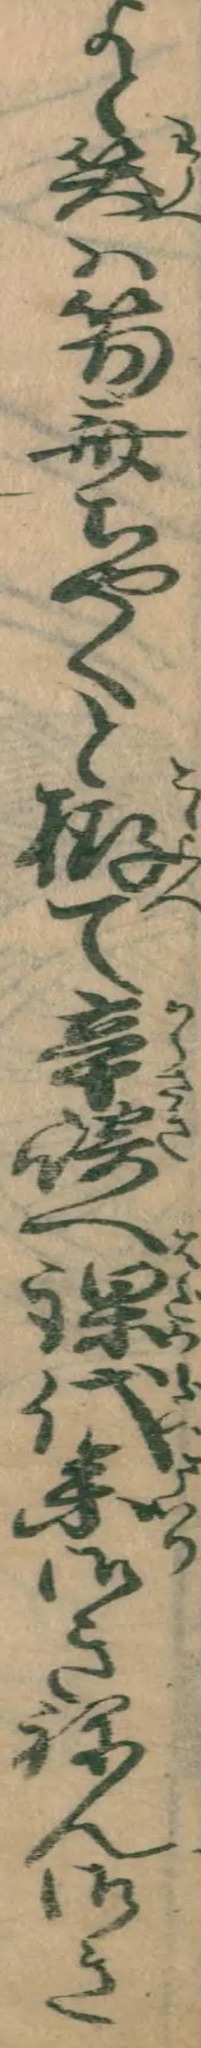よと笑は筍斎ちやくと拵て辛崎へ裸代参御きねん御き
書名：新竹斎 5巻
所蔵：国立国会図書館 National Diet Library, JAPAN
